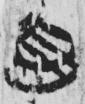面
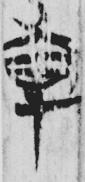○（皯）
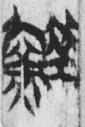○（皵）
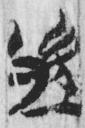○（脛）
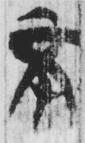不
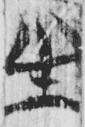生
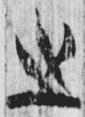之
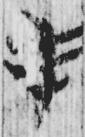毛
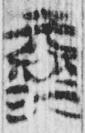濏
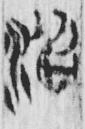湝
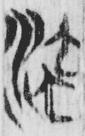流
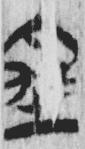○（禹）
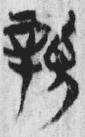親
